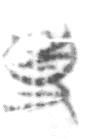事
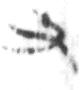又
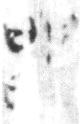器
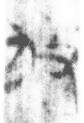放
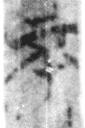不
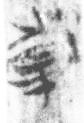倝
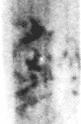○（煎）
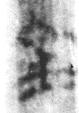齊（劑）
